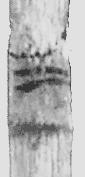{廿二}
